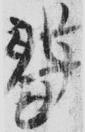○（莊）
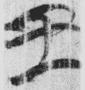王
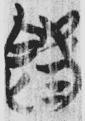既
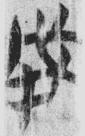成
